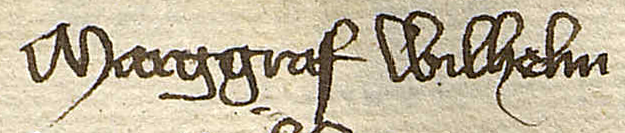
Marggraf Wilhelm
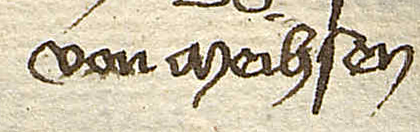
von Meihſen
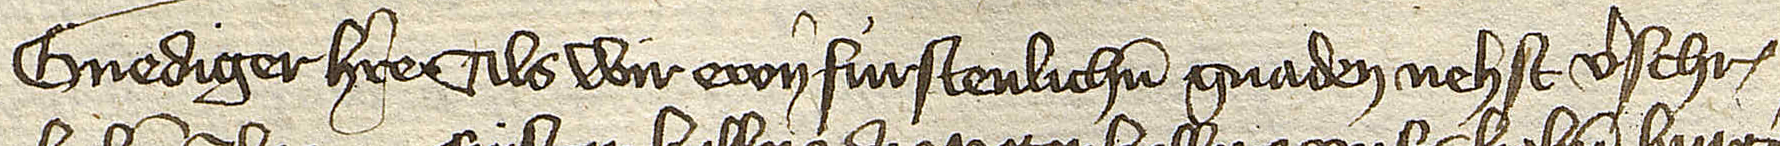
Gnediger h*re . Als wir ew*n fürſtenlichn* gnaden nehſt v*ſchr*
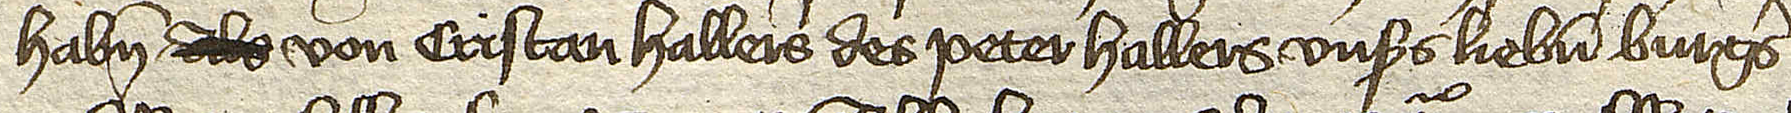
habn* / Als von Criſtan hallers des peter hallers vnſ*s liebn* burg*s
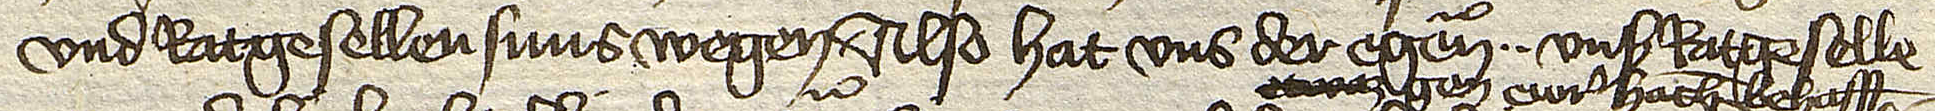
vnd Ratgeſellen ſuns wegen / Alſo hat vns der egen* ~ vnſ* Ratgeſelle
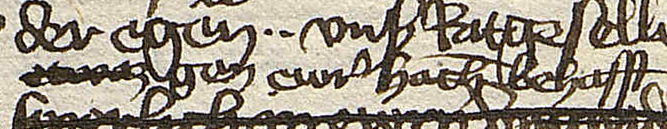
etwaʒ gen ewr* hoch* behafft
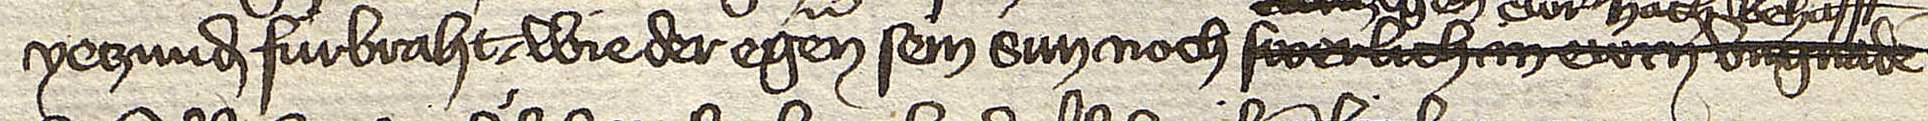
yecʒund* fürbraht / wie der egen* ſein Sun noch ſwerlich in ewrn* vngnade*
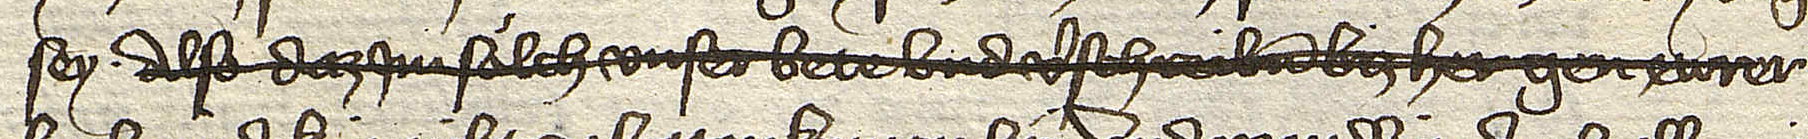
ſey . Alſo daʒ Im ſölich vnſer bete vnd v*ſchreibn* biʒ her gen ewrer
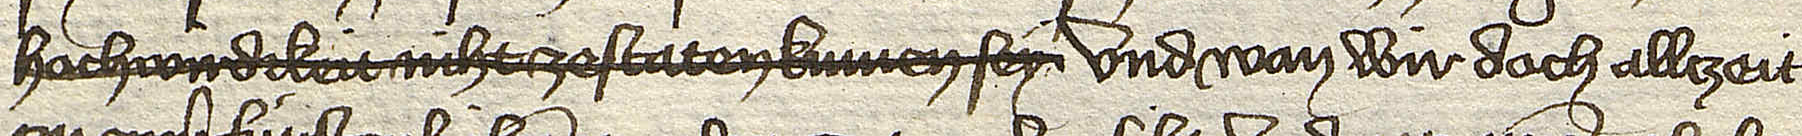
hochwirdikeit niht cʒeſtaten kumen ſey . Vnd wan wir doch allcʒeit
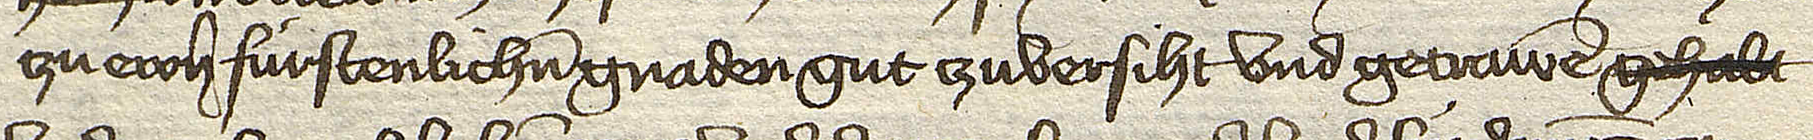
cʒu ewn* fürſtenlichn* gnaden gut cʒuverſiht vnd getrawe* gehabt
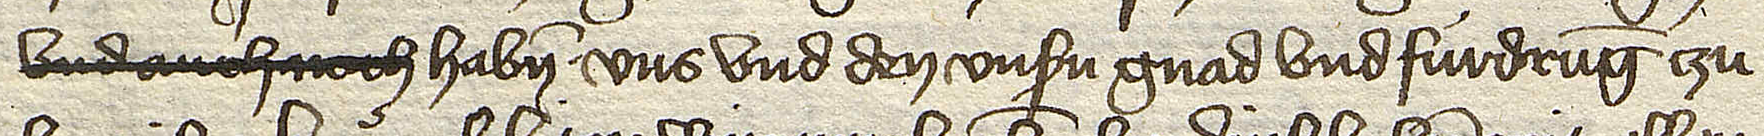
vnd auch noch habn* . vns vnd den vnſ*n gnad vnd fürdru*g cʒu
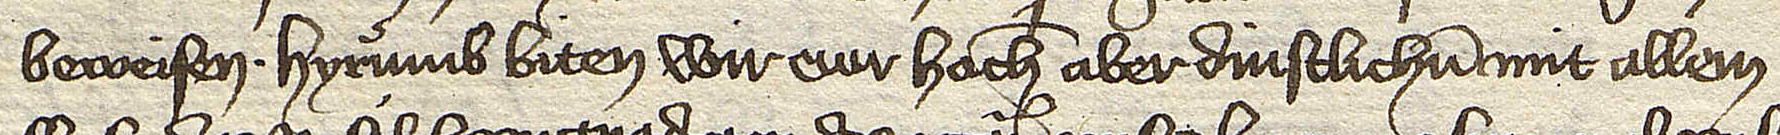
beweiſen . hyrümb biten wir ewr hoch* aber dinſtlichn* mit allem
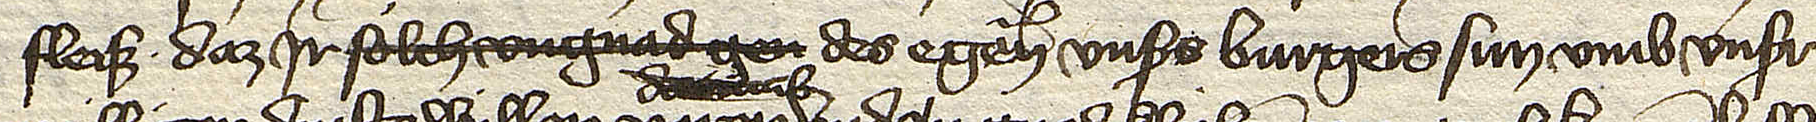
fleiſʒ . daʒ Ir ſölich vngnad gen des egen* vnſ*s burgers ſun vmb vnſ*r
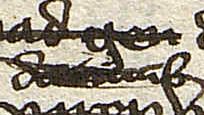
darümb
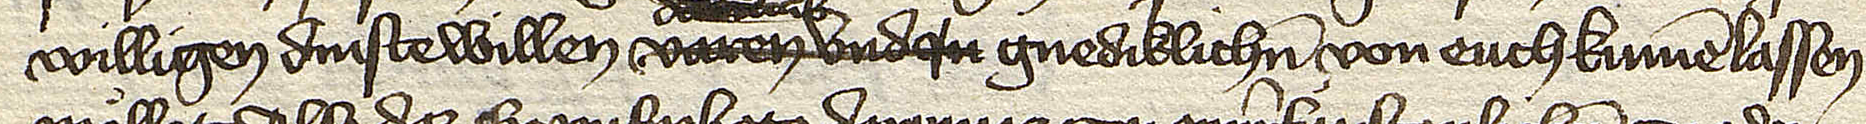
willigen dinſte willen varen vnd In gnedklichn* von euch kume* laſſen
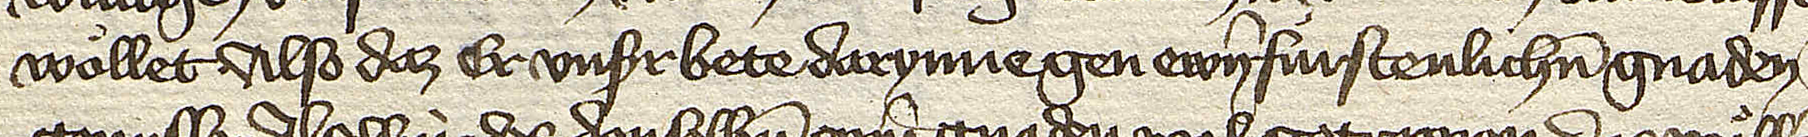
wöllet . Alſo daʒ Er vnſ*r bete darynne gen ew*n fürſtenlichn* gnaden
